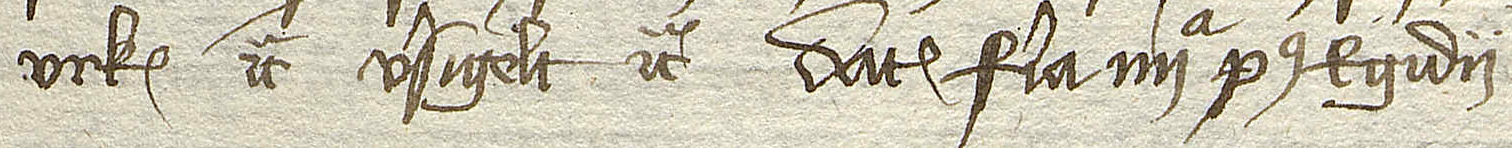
vrk* ec* v*ſigelt ec* Dat* fia* iiii* p* Egidii
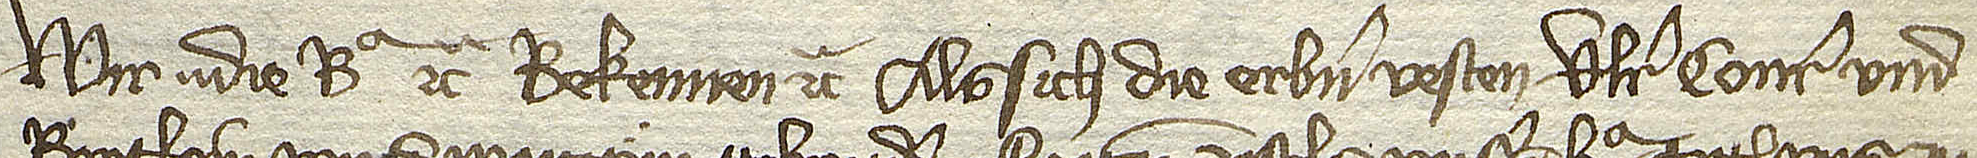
Wir ~ die B* ec* Bekennen ec* Als ſich die erbn* veſten Vlr* Conr* vnd
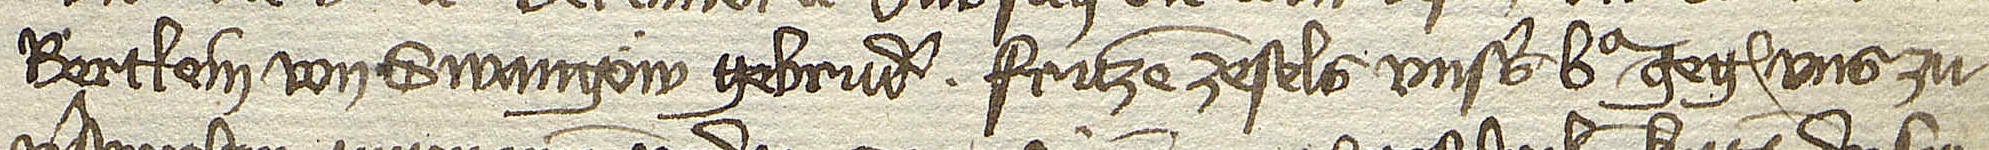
Bertlein von Swangöw gebrud* . fricʒe ʒeſels vnſ*s b* / geg* vns ʒu
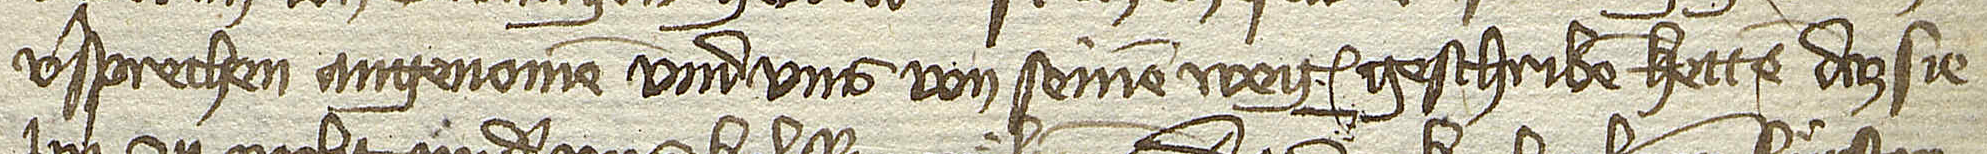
v*ſprechen angenome* vnd vns von ſeine* weg* geſchribe* hette* daʒ ſie
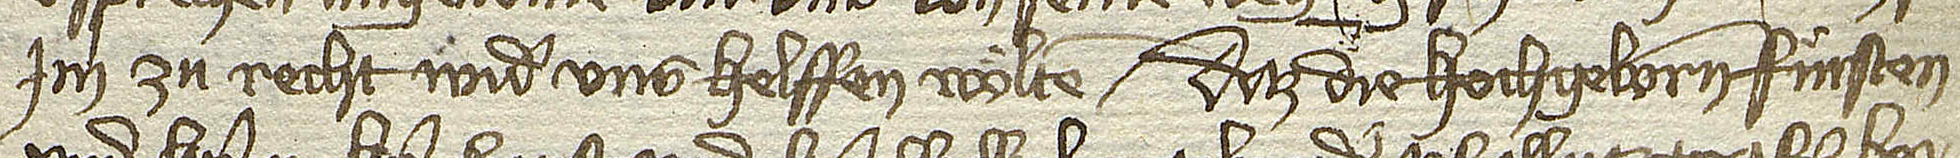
Im ʒu recht wid* vns helffen wölte* / Daʒ die hochgeborn* fürſten
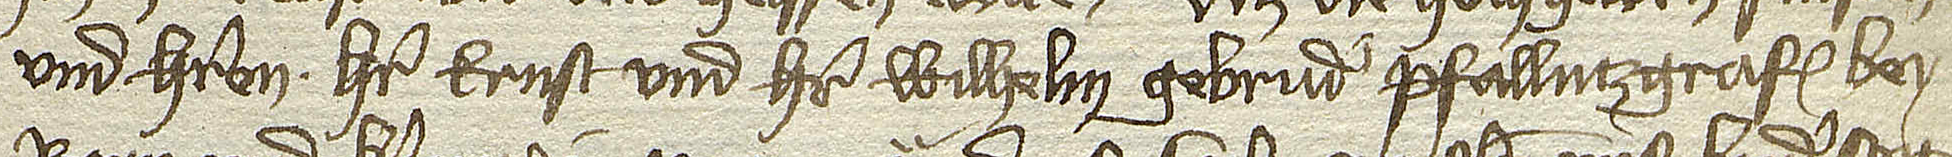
vnd h*ren . hr* Ernst vnd hr* Wilhelm gebrud* Pfallncʒgraf* bey
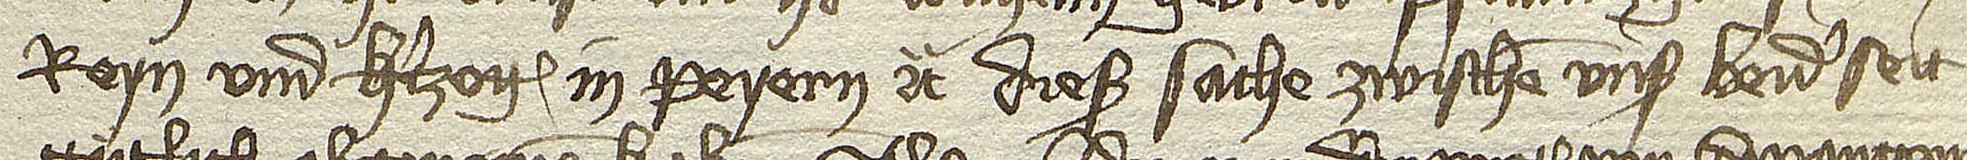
Reyn vnd h*cʒog* in Peyern ec* dieſ* ſache ʒwiſche* vnſ* beid* ſeit
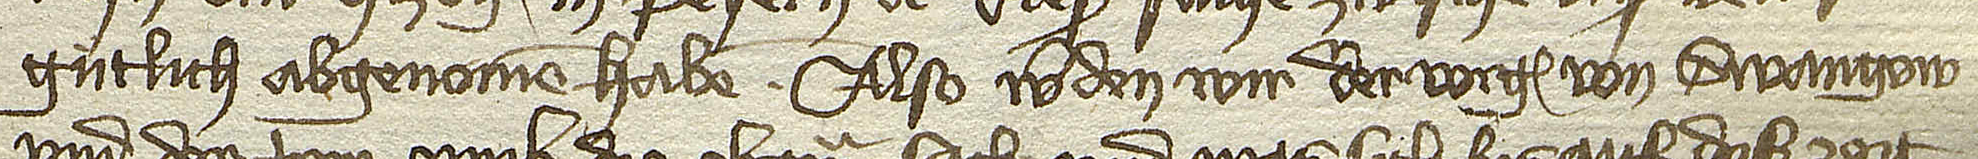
gütlich abgenome* habe* . Alſo w*den wir der vorg* von Swangow
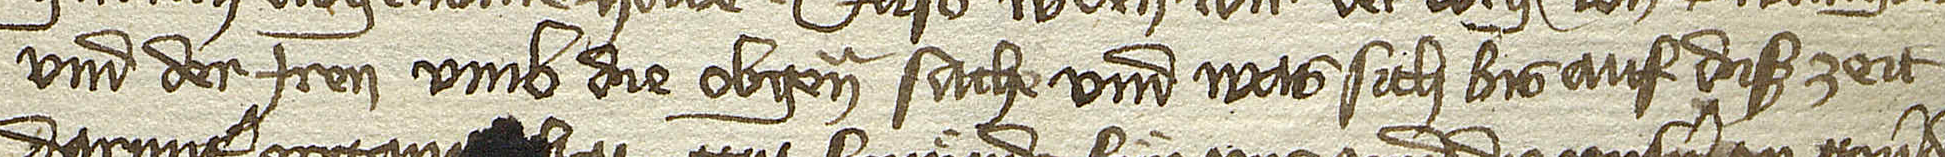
vnd der Iren vmb die obgen* ſache vnd was ſich bis auf diſʒ ʒeit
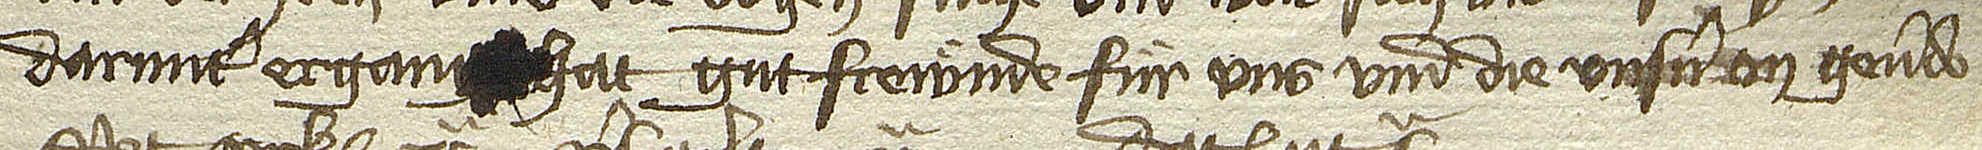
darunt* ergan%% hat gut frewnde für vns vnd die vnſ*n on geu*de
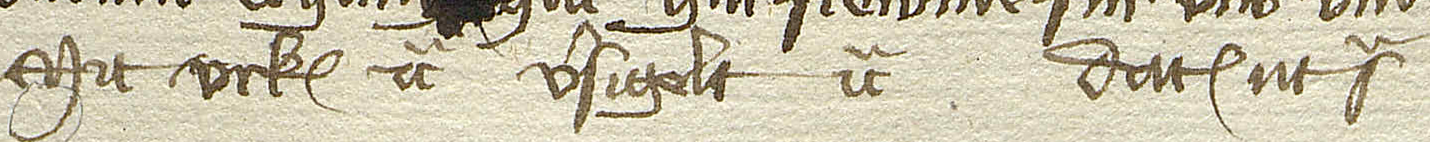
Mit vrk* ec* v*ſigelt ec* dat* ut ſ*
